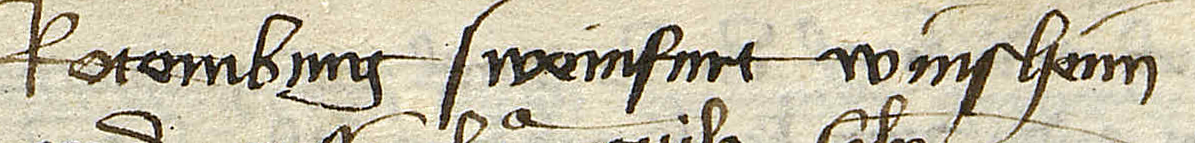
Rotemburg ſweinfurt winſheim
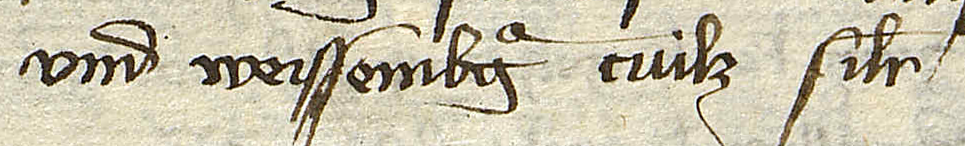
vnd weiſſembg* cuil* ſilr*
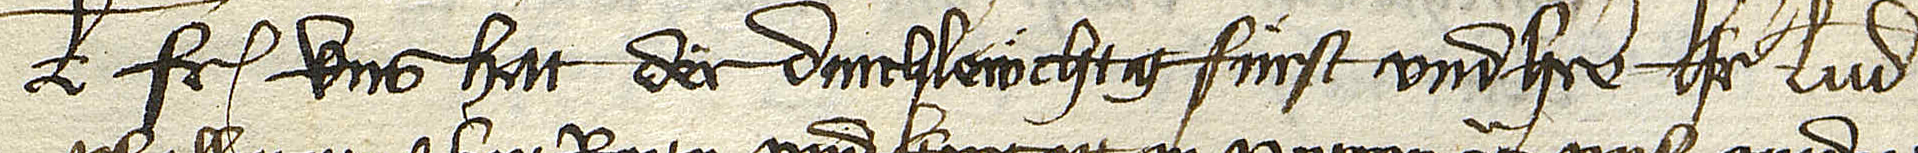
L* fr* vns hat der durchlewchtig fürſt vnd hre* Hr* Lud*
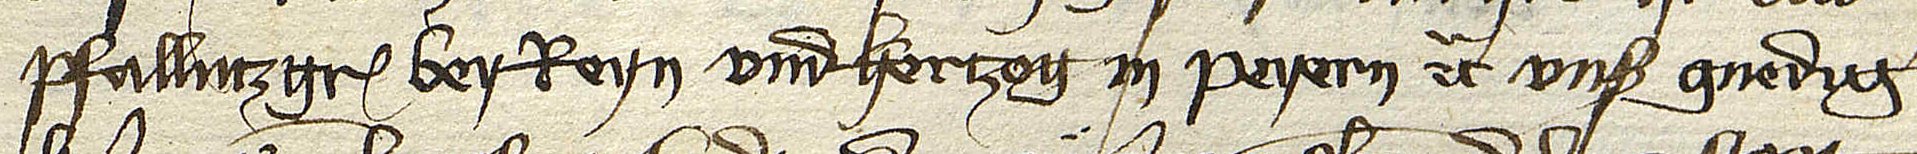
pfallncʒgr* bey Reyn vnd hercʒog in Peyern ec* vnſ* gnedig*
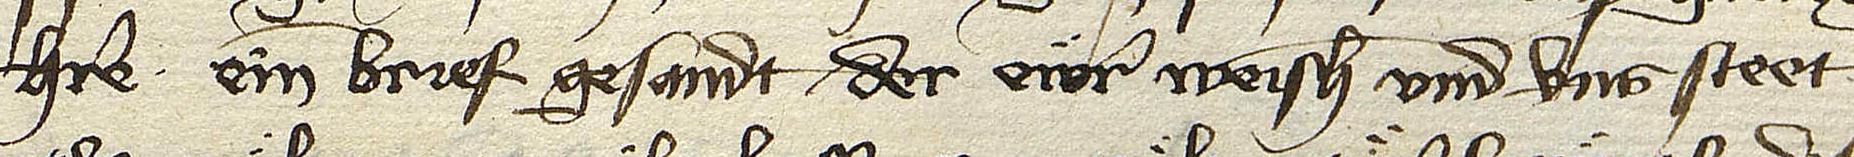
hre* . ein* brief geſandt / der ewr weiſh* vnd vns ſteet .
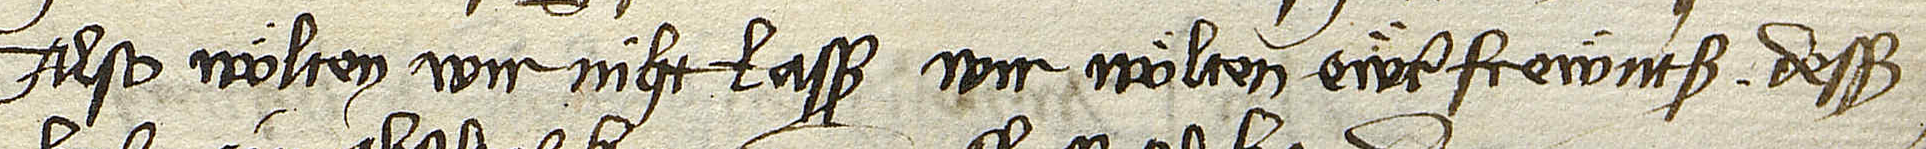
Alſo wölten wir niht laſſ* wir wölten ewr* frewntſ* . deſſ*
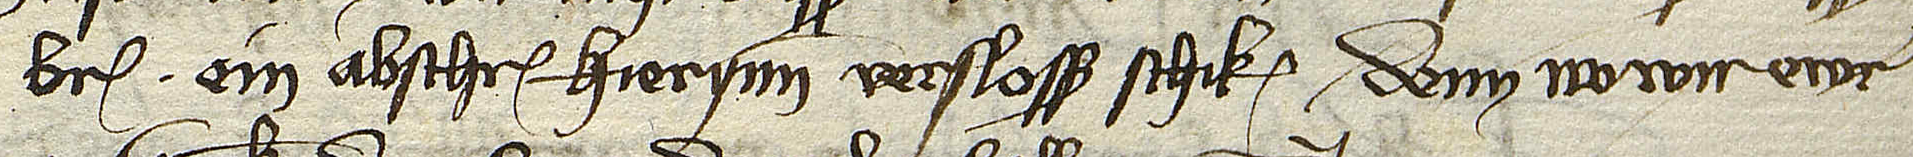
br* . ein abſchr* hierynn* verſloſſ* ſchik* / Denn wo wir ewr*
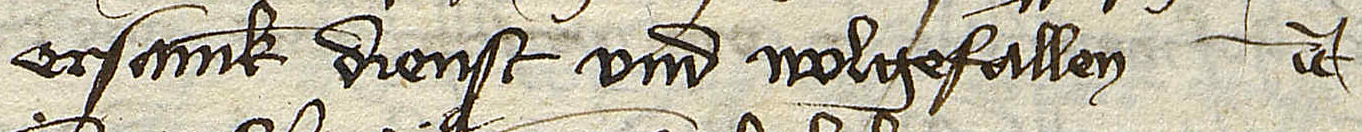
erſamk* dienſt vnd wolgefallen ec*
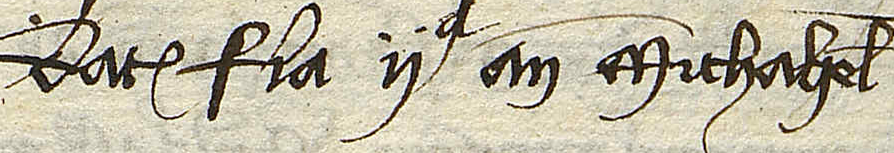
Dat* f*ia ii* an* Michahel*
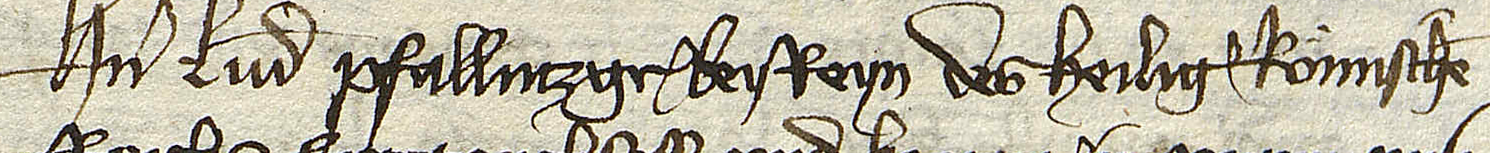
Hn* Lud* pfallncʒgr* bey Reyn des heilig* Römiſche*
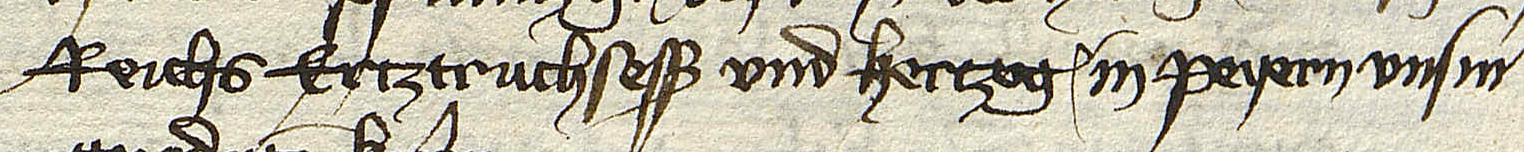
Reichs Ercʒtruchſeſſ* vnd hercʒog* in Peyern vnſm*
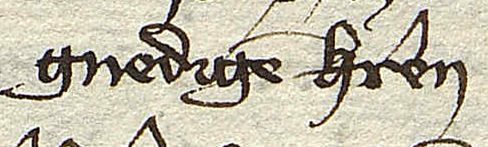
gnedige* hren*
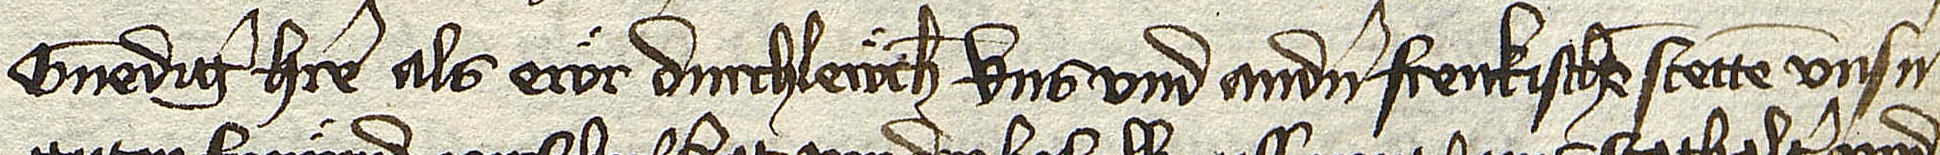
Gnedig* hre* als ewr durchlewch* Vns vnd andn* frenkiſche* ſtette* vnſn*
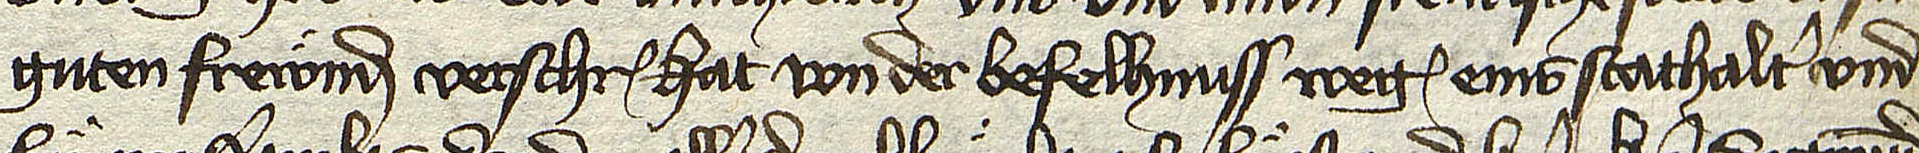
guten frewnd* verſchr* hat von der befelhnuſſ weg* eins ſtathalt* vnd
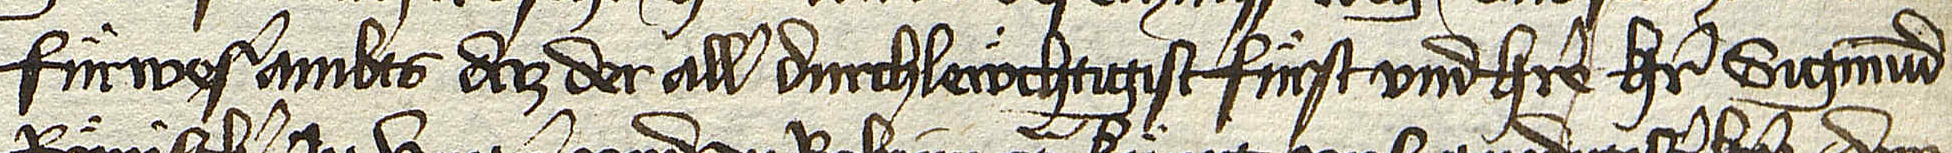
fürweſ* ambts daʒ der all* durchlewchtigiſt* fürſt vnd hre* hr* Sigmud*
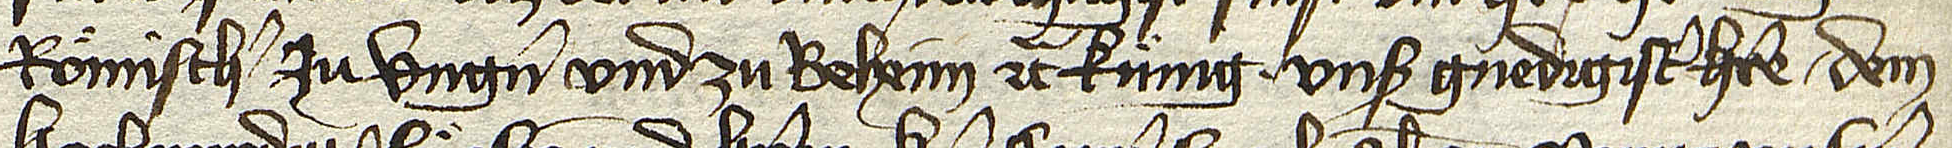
Römiſch* ʒu Vngn* vnd ʒu Beheim ec* künig . vnſ* gnedigiſt* hre* / dem
